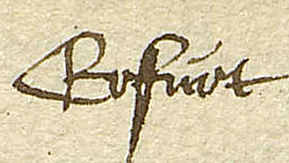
Erfürt
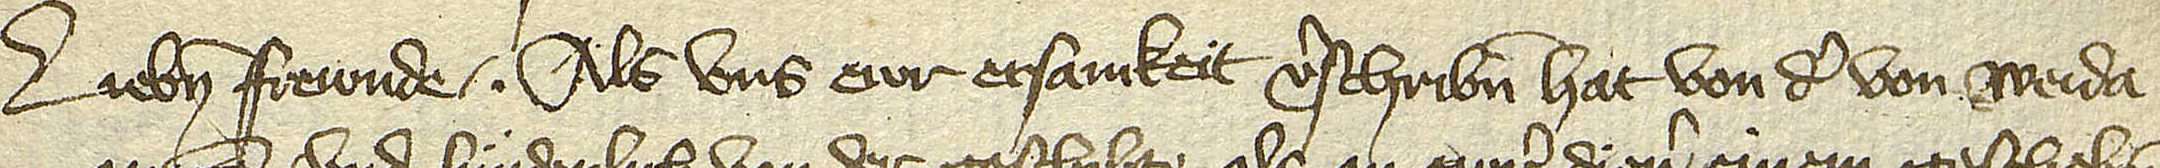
Liebn* frewnde / . Als vns ewr erſamkeit v*ſchribn* hat von d* von we%da
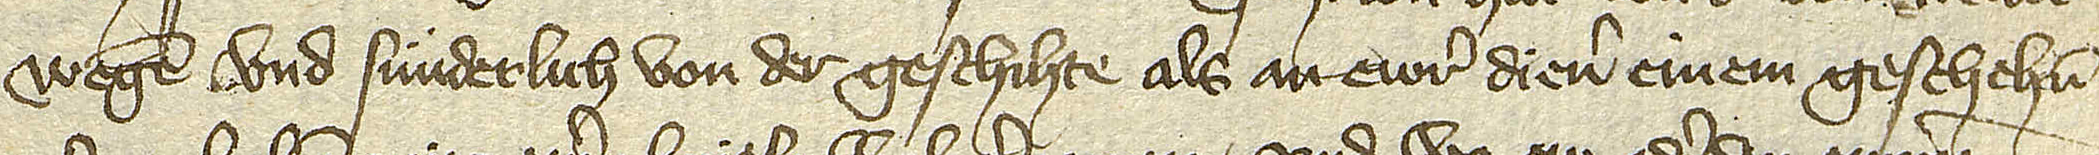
wege* / vnd ſünderlich von der geſchihte als an ewr* dien* einem geſchehn*
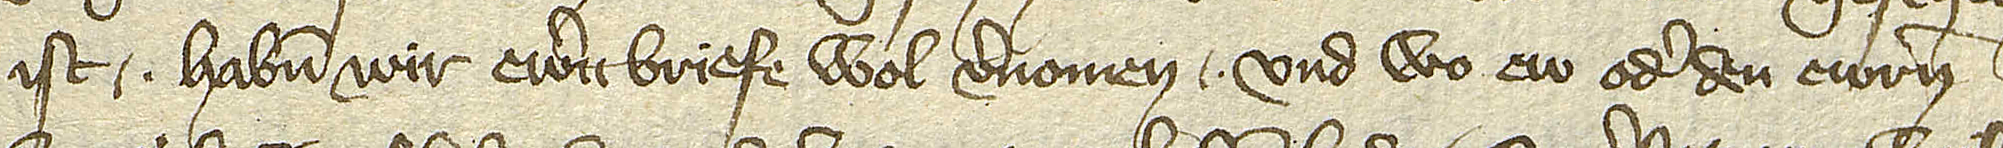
iſt / . habn* wir ew*n briefe wol v*nomen / vnd wo ew od* den ewrn*
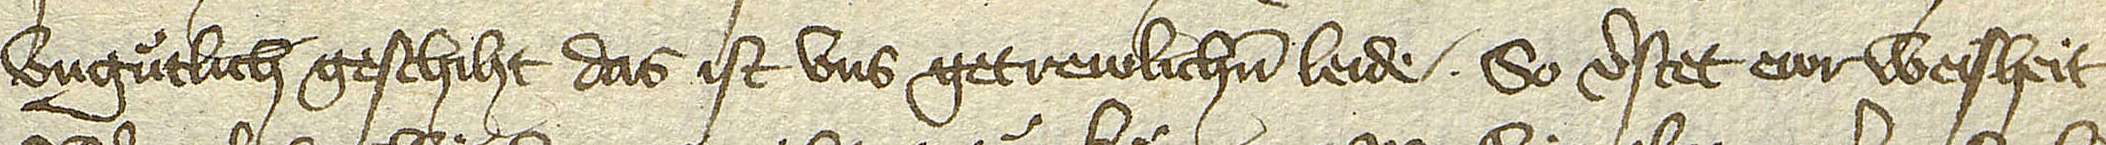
vngütlich geſchiht das iſt vns getrewlichn* leide / . So v*ſtet ewr weiſheit
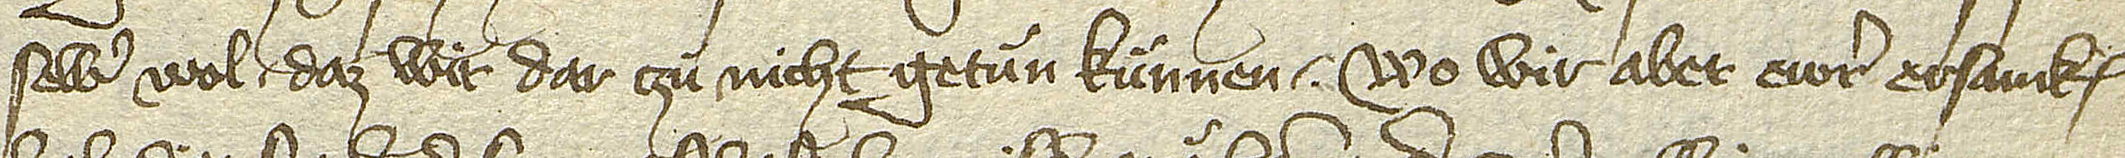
ſelb* wol / daʒ wir dar cʒü nicht getün künnen / . wo wir aber ewr* erſamk*
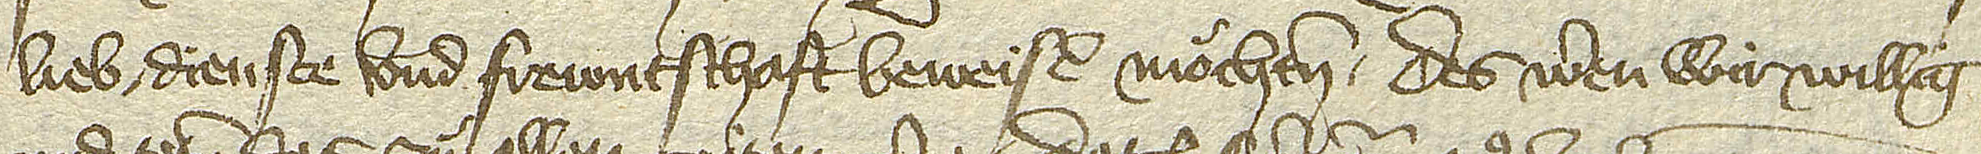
lieb / dienſte vnd frewntſchaft beweiſe möchtn* / Des w*en wir willig
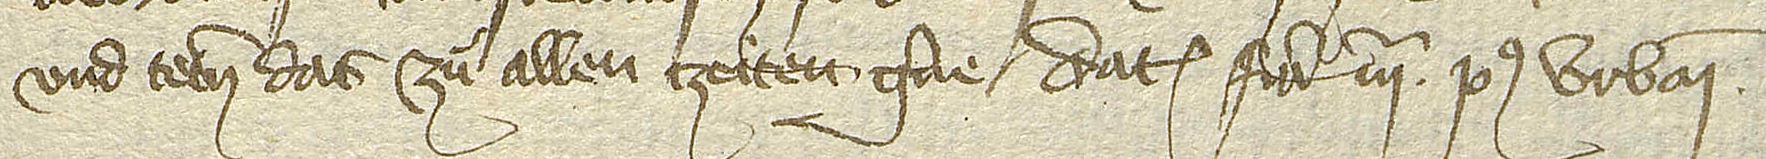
vnd tetn* das cʒü allen cʒeiten g*ne / Dat* fia* iii* . p* Vrbai* .
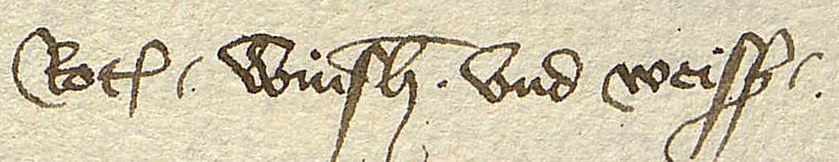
Rot* / winſh* . vnd weiſſ* / .
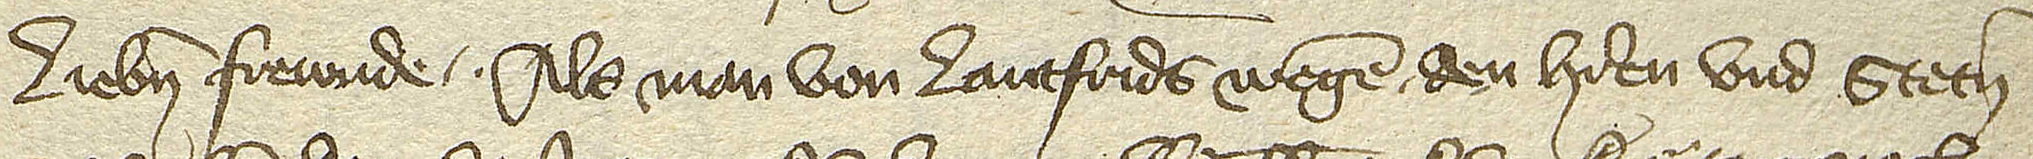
Liebn* frewnde / . Als man von Lantfrids* wege* / den hr*en vnd Stetn*
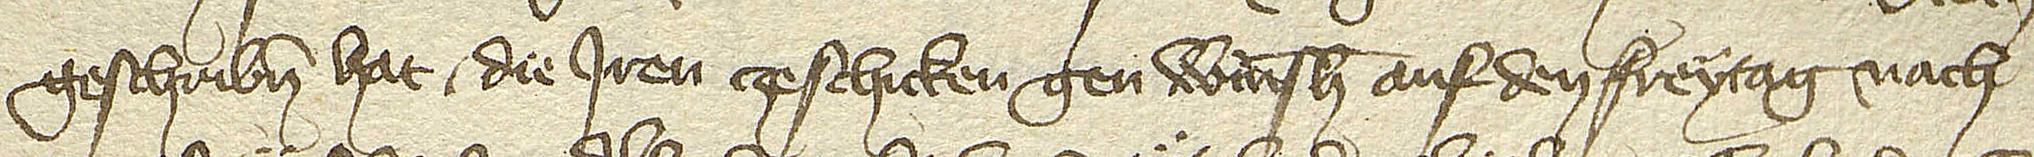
geſchribn* hat / die Iren cʒeſchicken gen winſh* auf den freytag nach
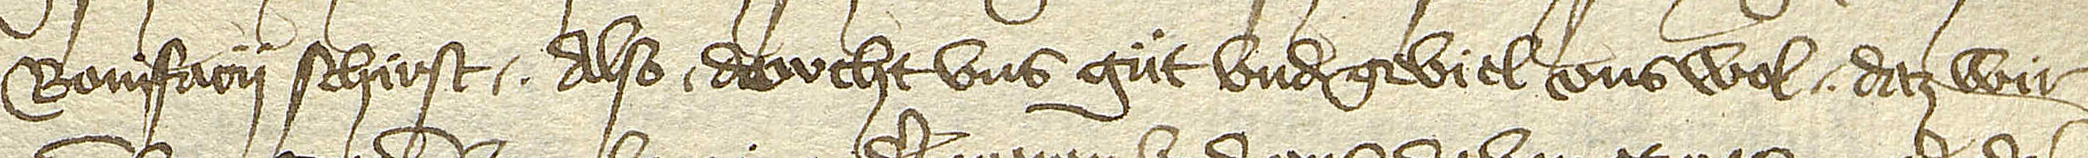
Bonifacii ſchirſt / . Alſo / dewcht vns güt vnd geviel vns wol / . daʒ wir
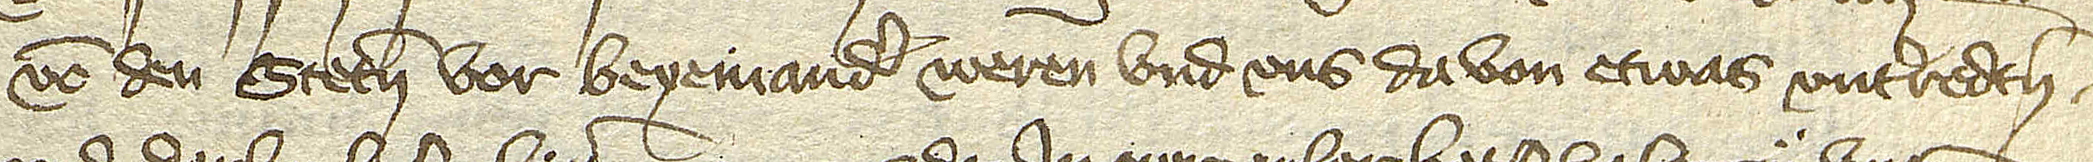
vo* den Stetn* vor beyeinand* weren vnd vns davon etwas vnt* redtn* /
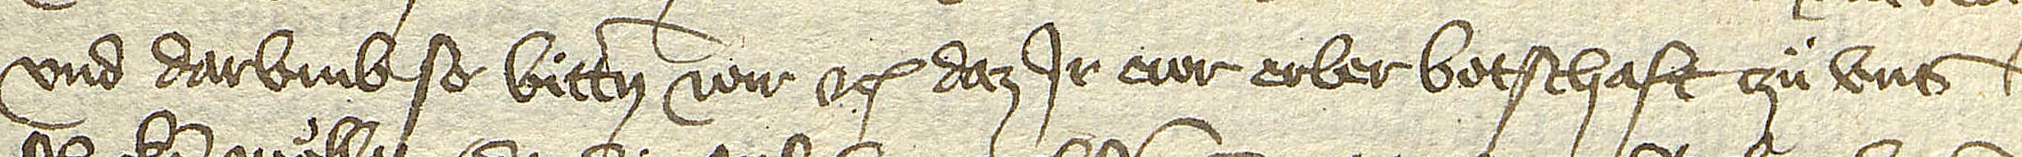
vnd darvmb ſo bittn* wir ec* daʒ Ir ewr erber botſchaft cʒü vns
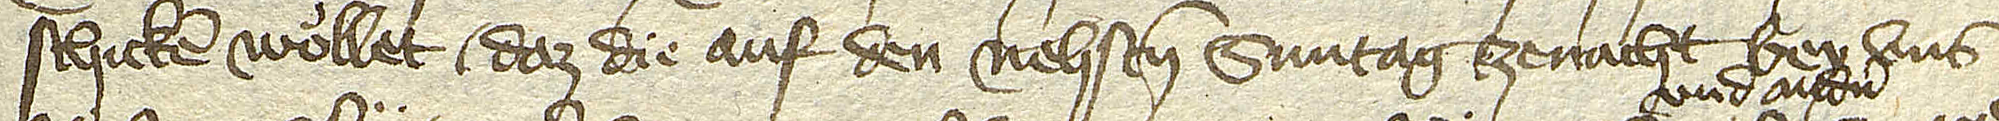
ſchicke* wöllet / daʒ die auf den nehſten* Suntag cʒenacht bey vns
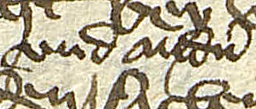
vnd andn*
